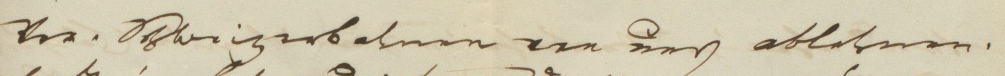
Ver. Schweizerbahnen von uns ablehnen.
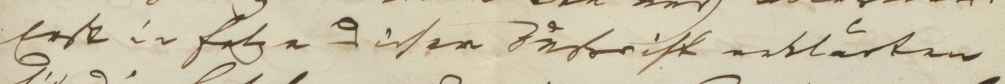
Erst in Folge dieser Zuschrift erklärten
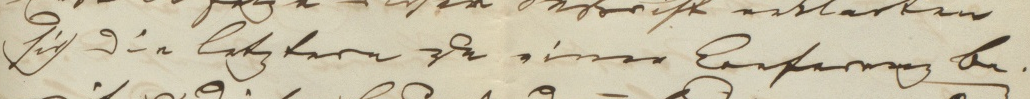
sich die letztern zu einer Conferenz be-
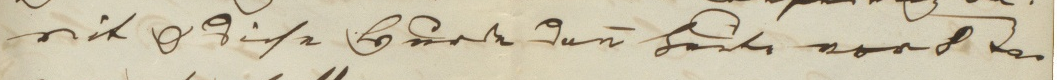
reit & diese wurde dann heute vor 8 Ta-
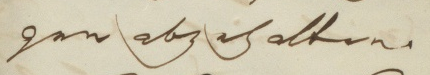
gen abgehalten.
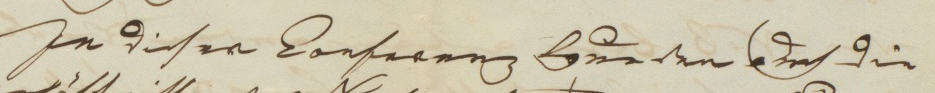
In dieser Conferenz wurden auch die
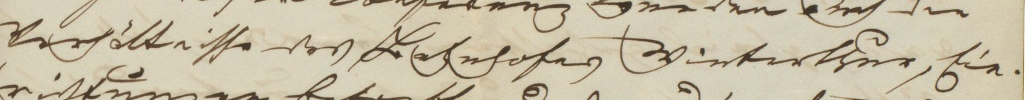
Verhältnisse des Bahnhofes Winterthur, Ein-
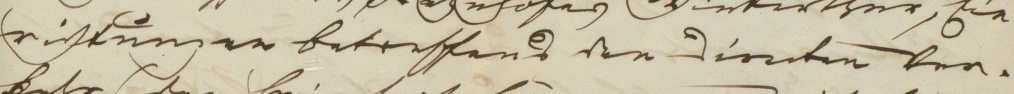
richtungen betreffend den directen Ver-
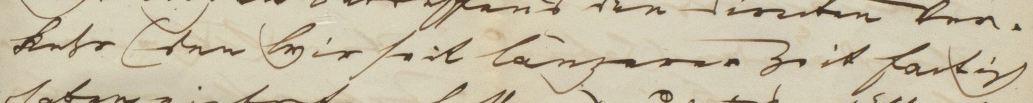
kehr (den wir seit längerer Zeit factisch
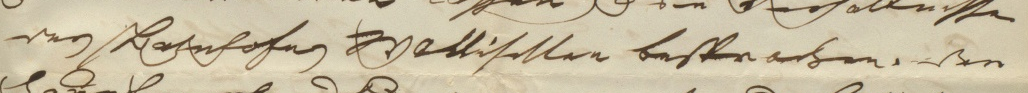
des Bahnhofes Wallisellen besprochen. Den
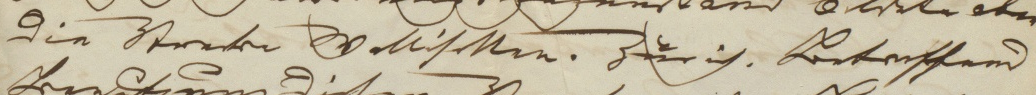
die Strecke Wallisellen–Zürich. Betreffend
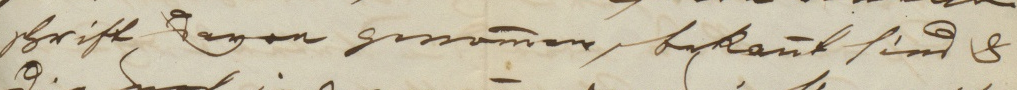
schrift davon genommen, bekannt sind &
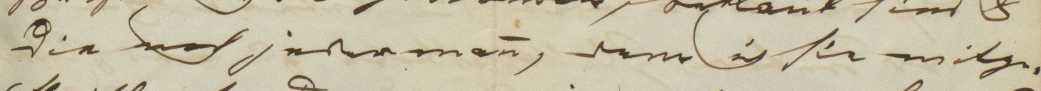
die noch jedermann, dem ich sie mitge-
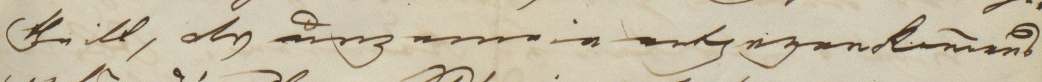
theilt, als ungemein entgegenkommend
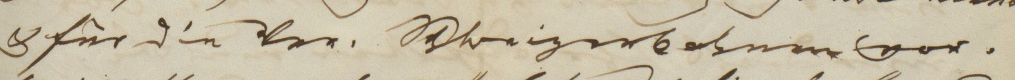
& für die Ver. Schweizerbahnen vor-
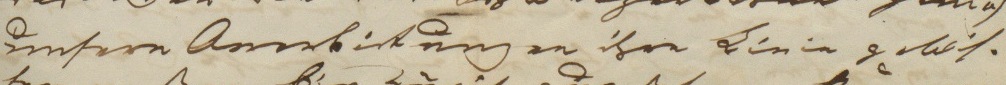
unsern Anerbietungen ihre Linie gewis-
